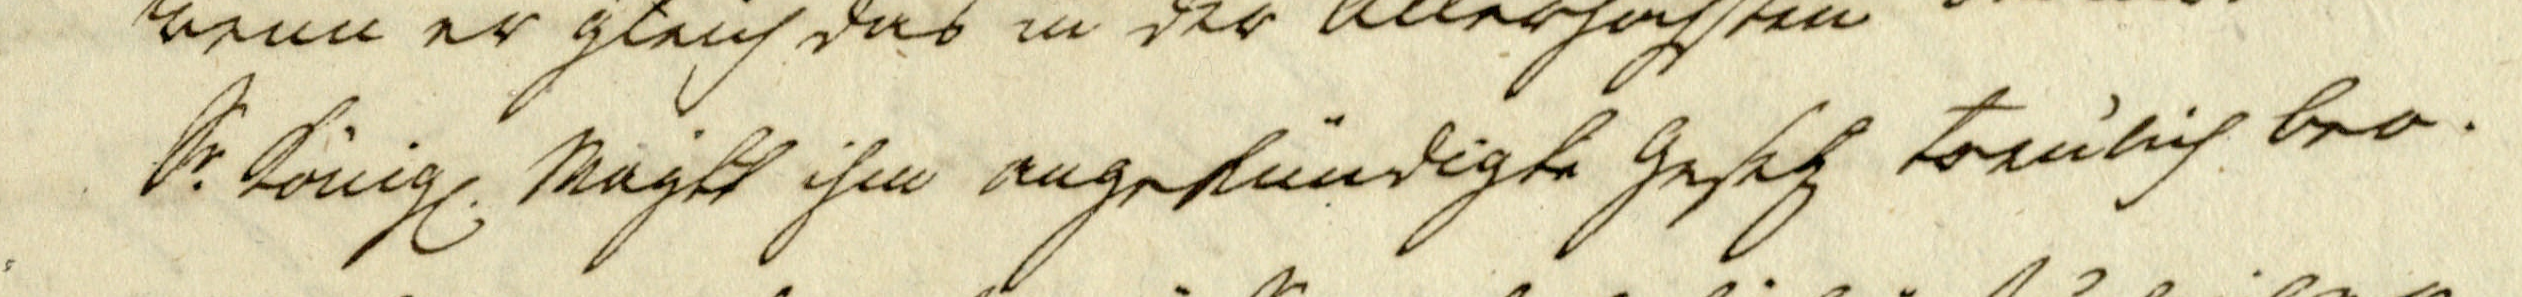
Sr. Königl. Maÿtt. ihm angekündigte Gesetz treulich beo¬
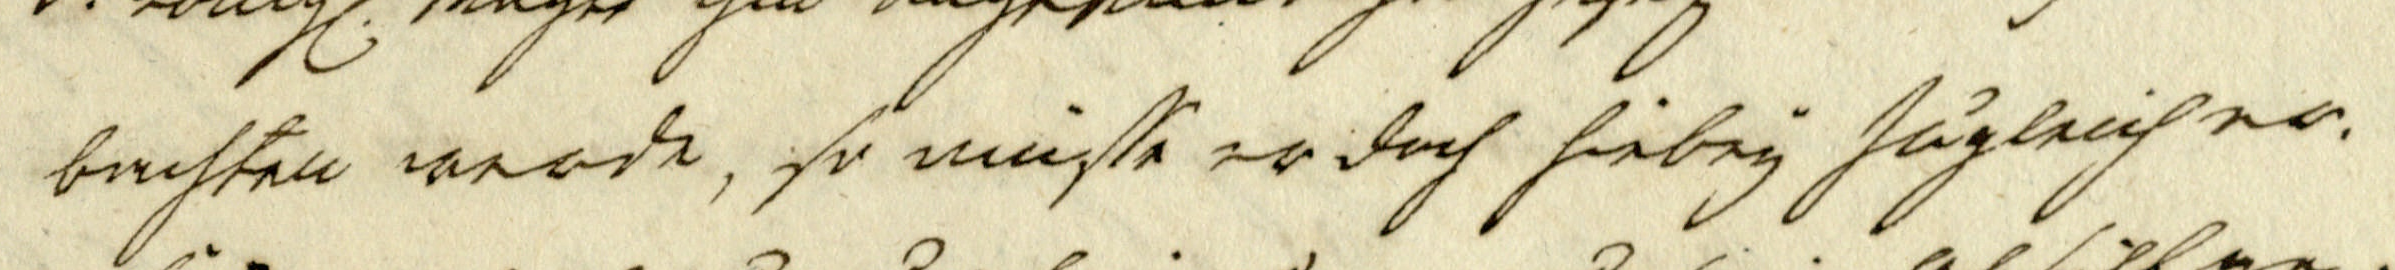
bachten werde, so müsse er doch hiebeÿ zugleich er¬
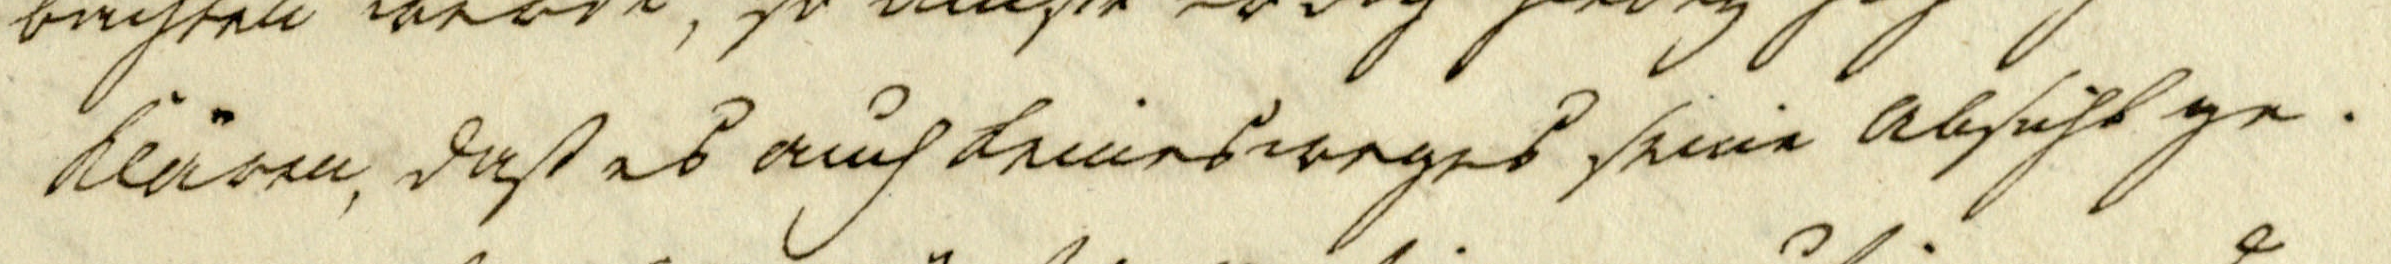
klären, daß es auch keinesweges seine Absicht ge¬
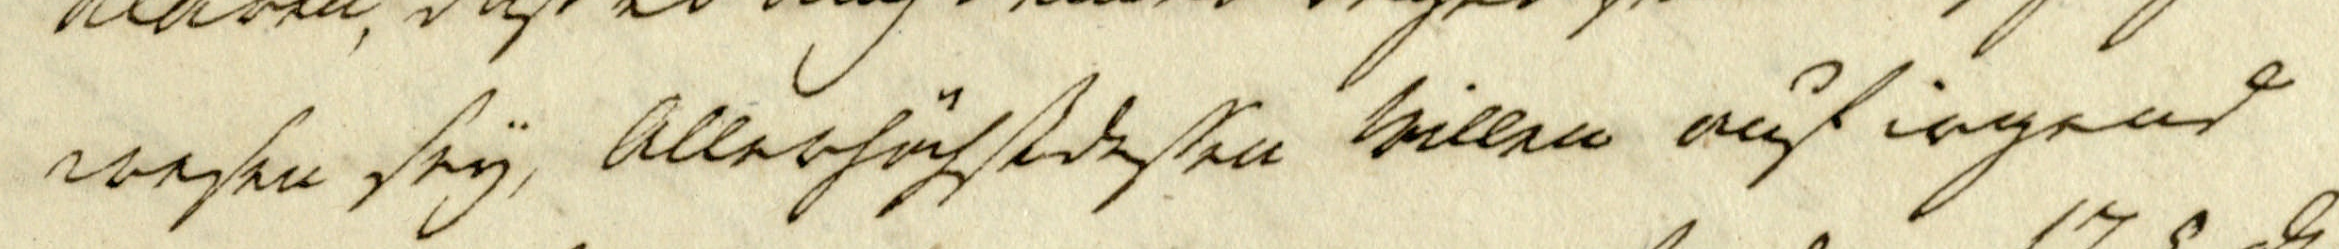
wesen seÿ, Allerhöchstdessen Willen auf irgend
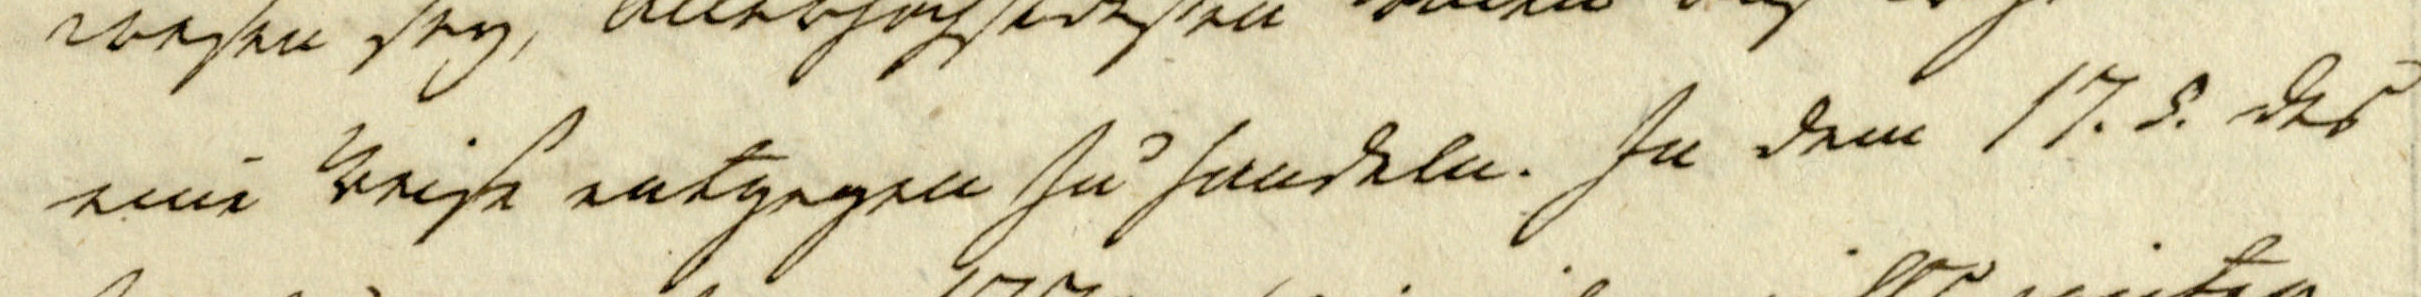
eine Weise entgegen zu handeln. In dem 17. § des
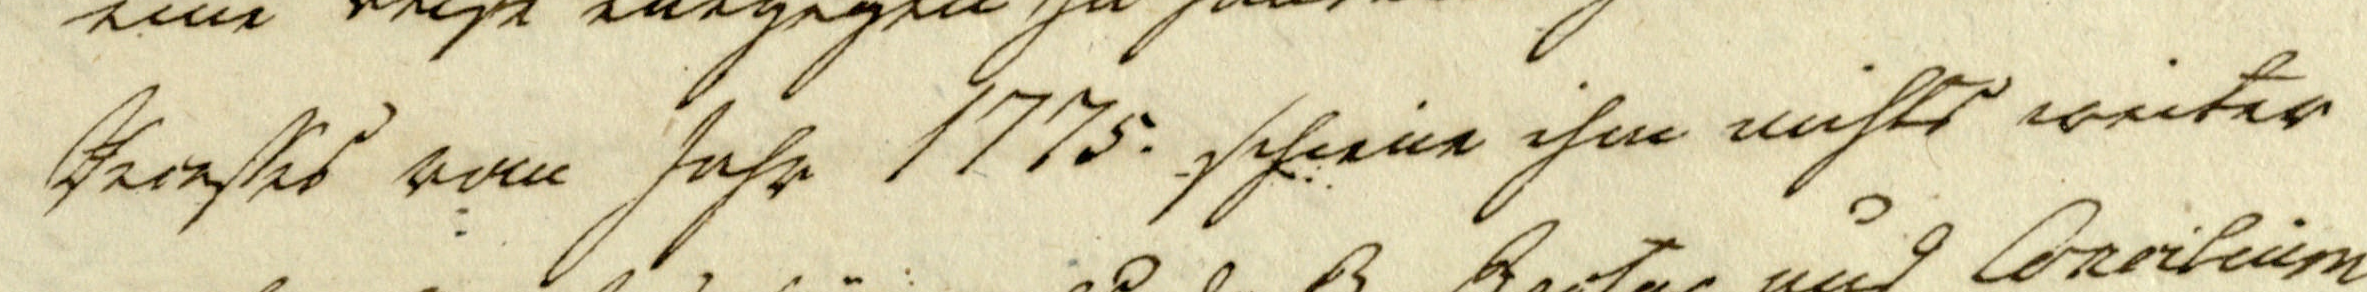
Recesses vom Jahr 1775. schien ihm nichts weiter
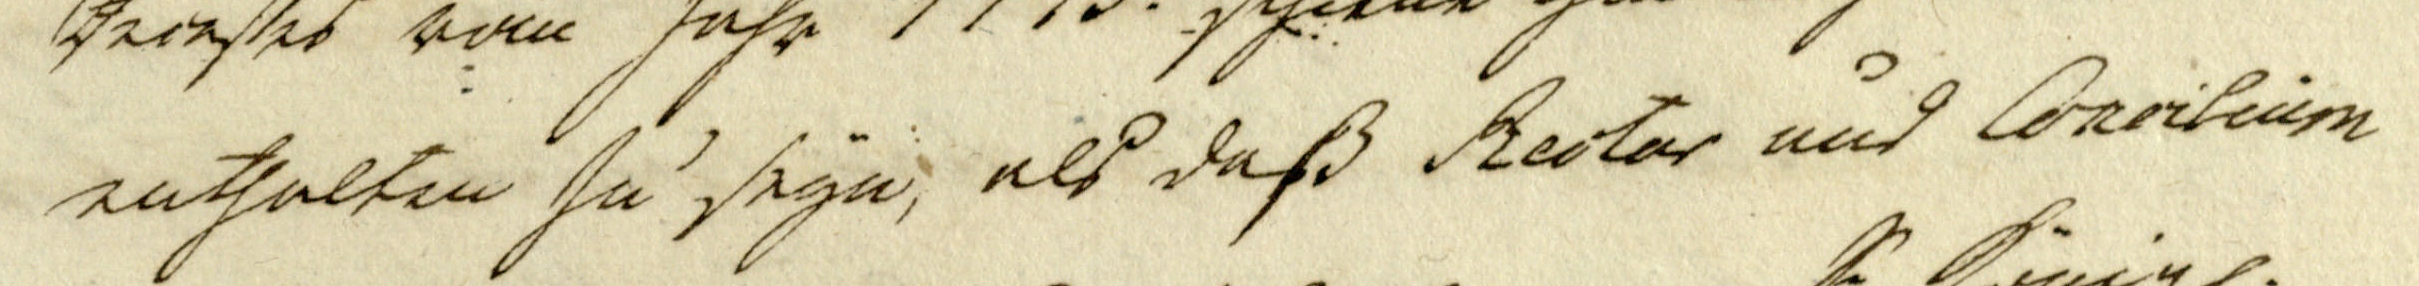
enthalten zu seÿn, als daß Rector und Concilium
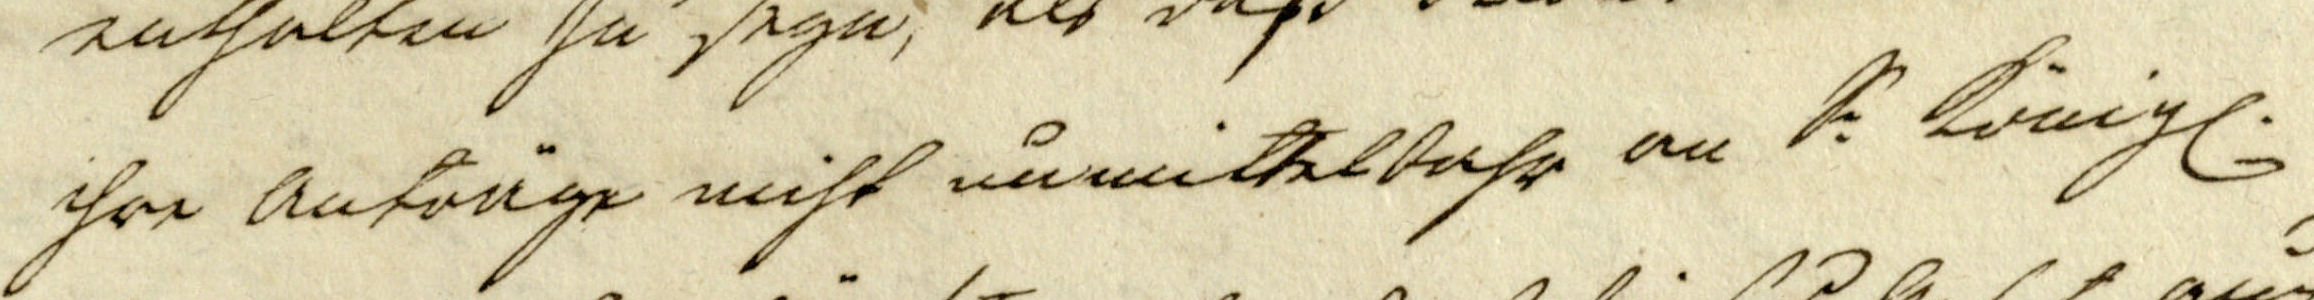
ihre Anträge nicht unmittelbahr an Sr. Königl.
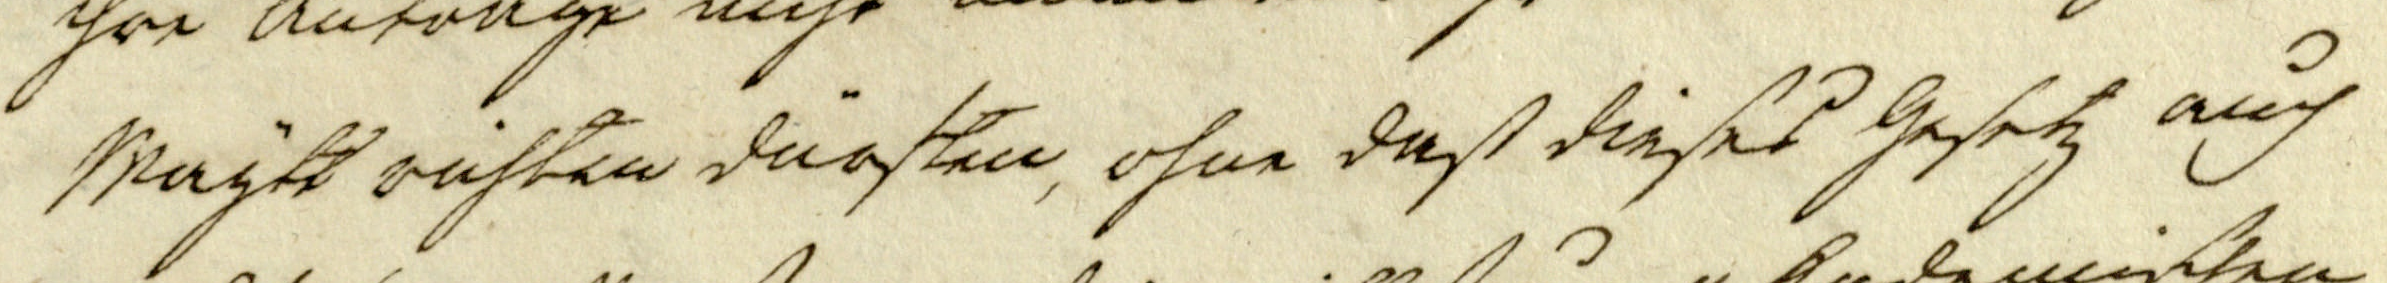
Maÿtt. richten dürften, ohne daß dieses Gesetz auch
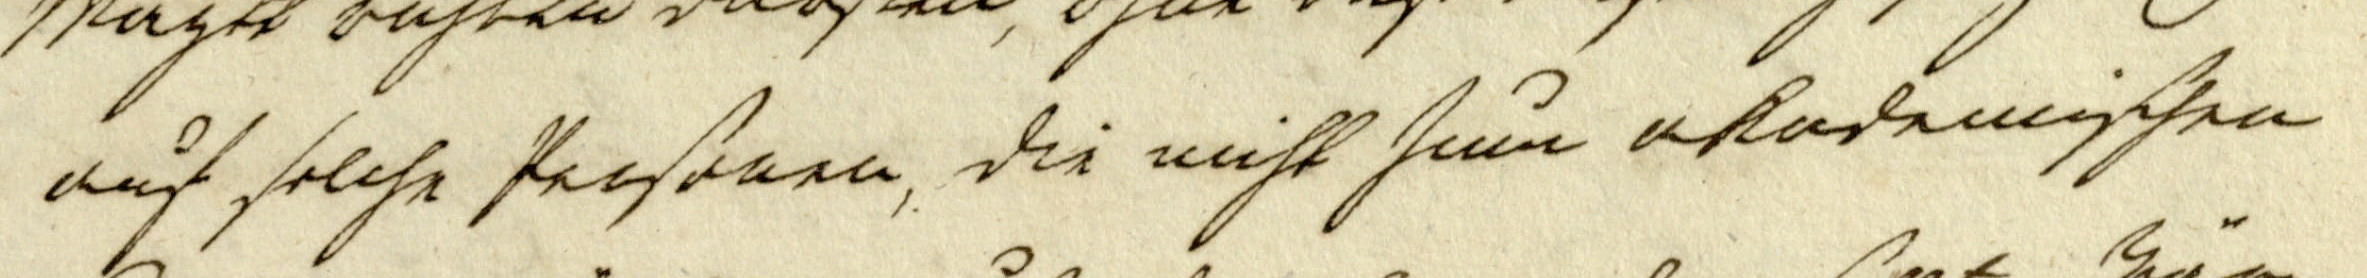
auf solche Personen, die nicht zum akademischen
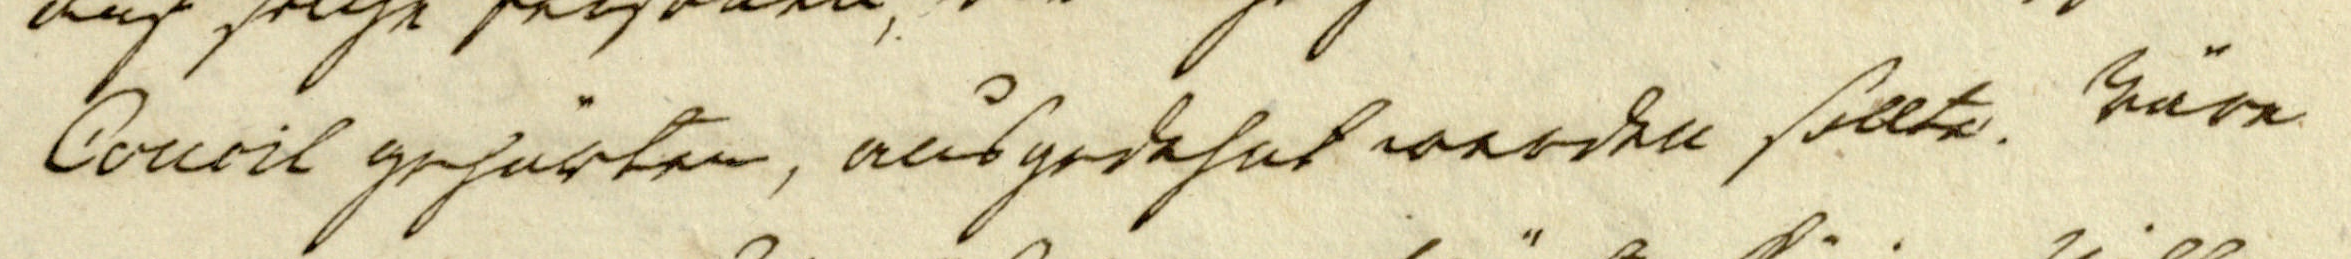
Concil gehörten, ausgedehnt werden sollte. Wäre
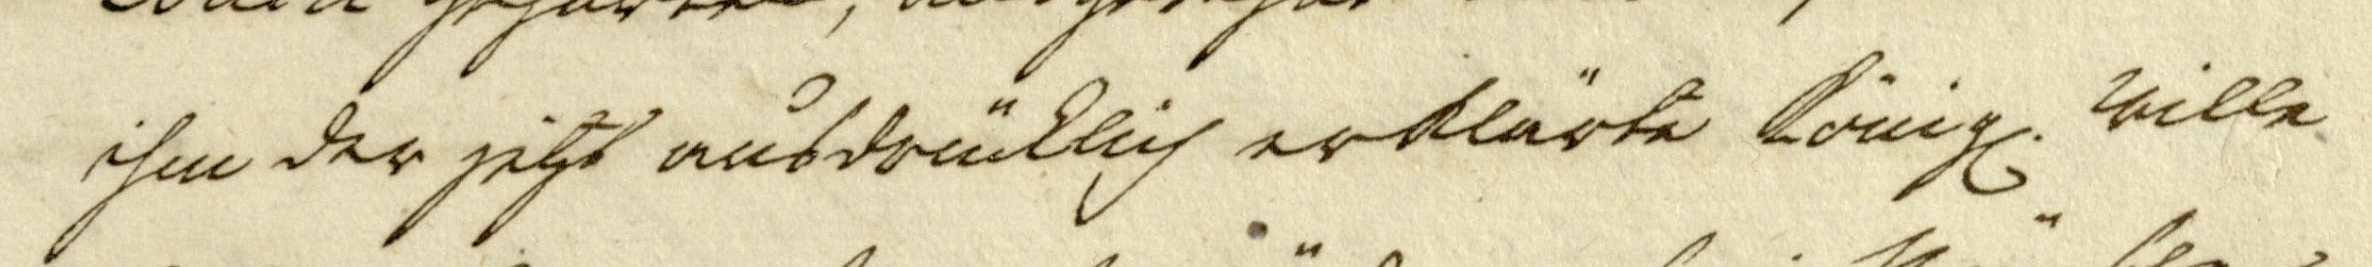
ihm der jetzt ausdrücklich erklärte Königl. Wille
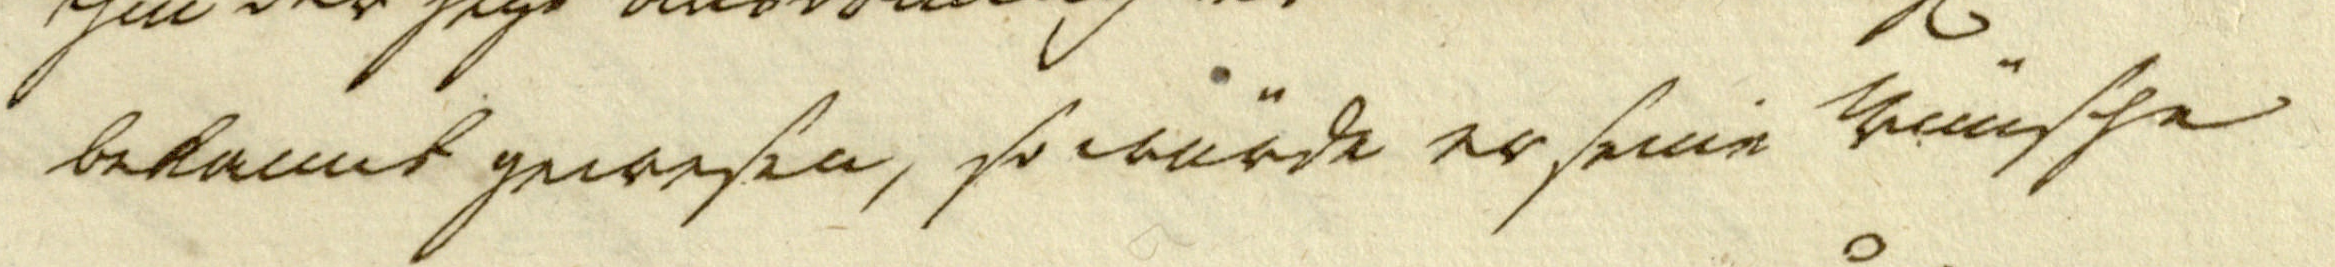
bekannt gewesen, so würde er seine Wünsche
